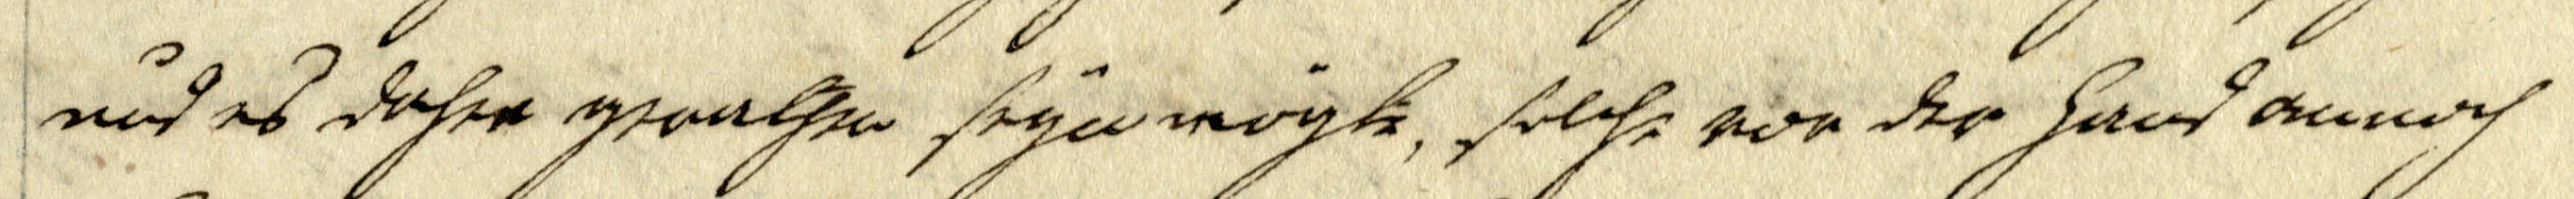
und es daher gerathen seÿn mögte, solche vor der Hand annoch
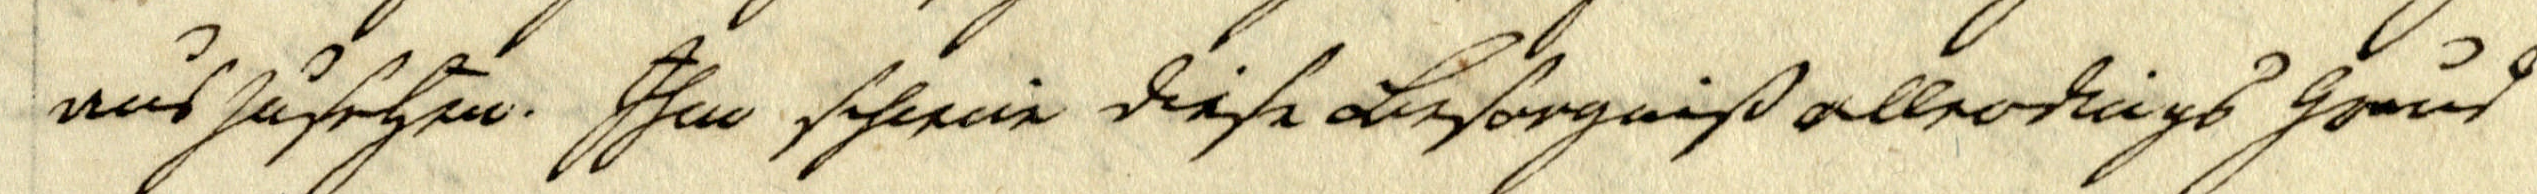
aus zusetzen. Ihm scheine diese Besorgniß allerdings Grund
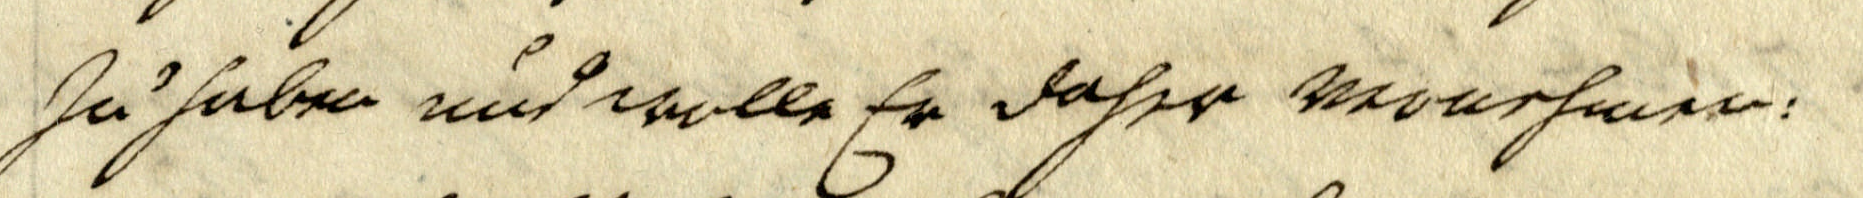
zu haben und wolle Er daher vernehmen:
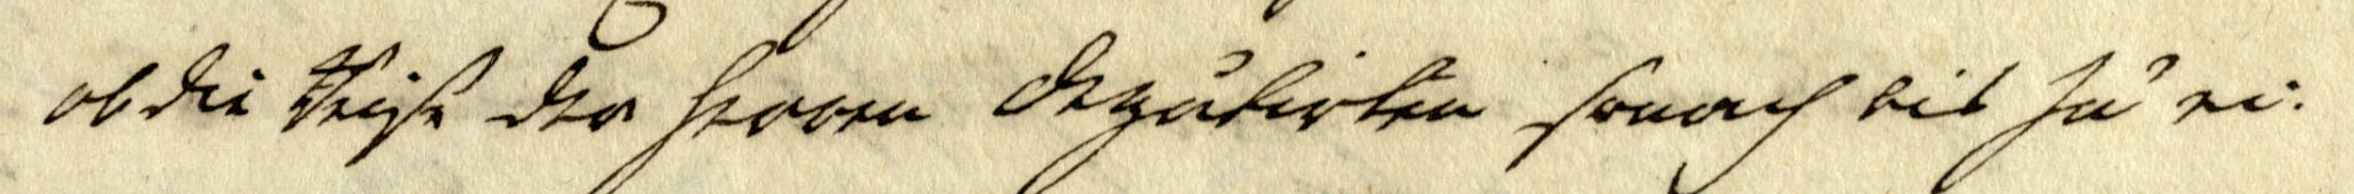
ob die Reise der herren Deputirten sonach bis zu ei¬
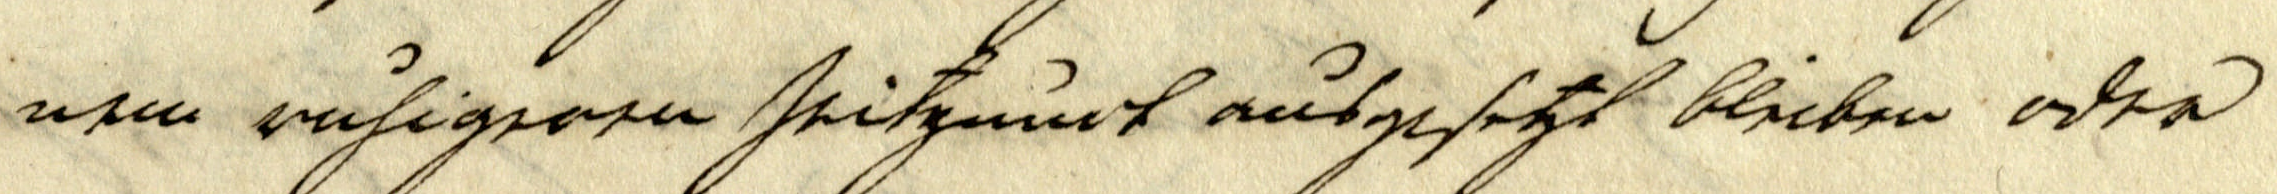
nem ruhigeren Zeitpunct ausgesetzt bleiben oder
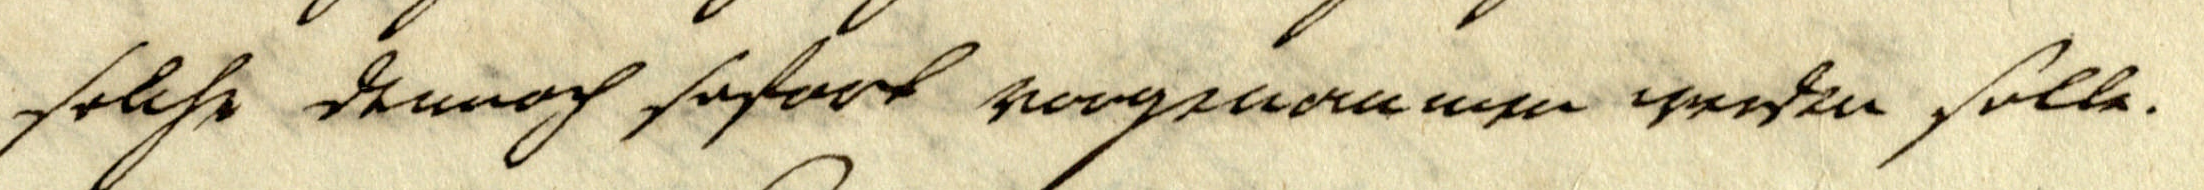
solche dennoch sofort vorgenommen werden solle.
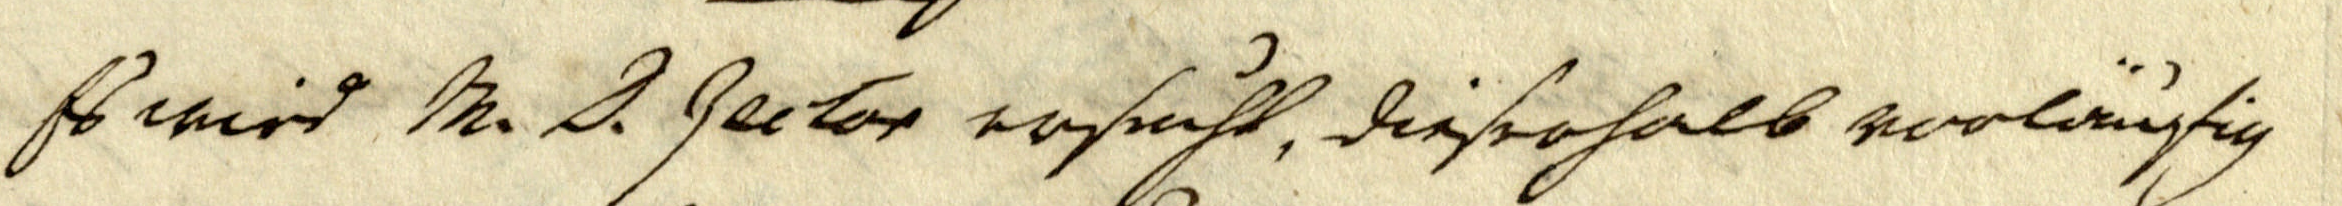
Es wird M. D. Rector ersucht, dieserhalb vorläufig
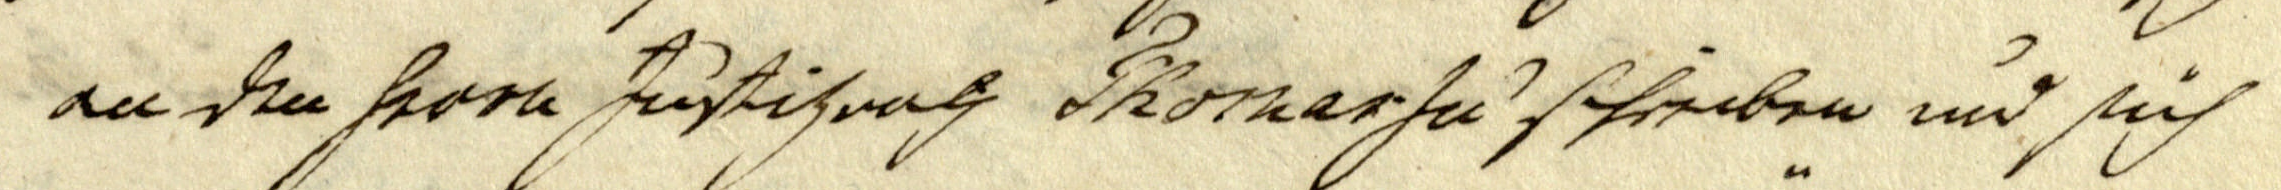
an den herrn Justizrath Thomas zu schreiben und sich
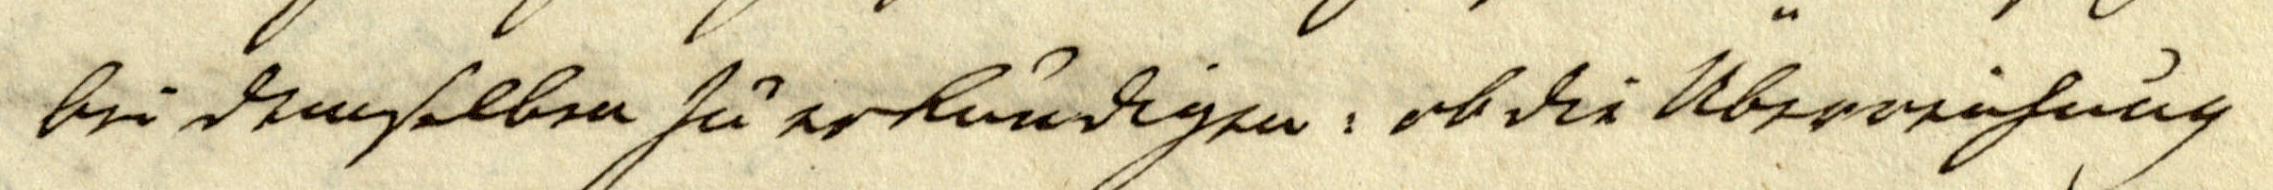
bei demselben zu erkundigen: ob die Überreichung
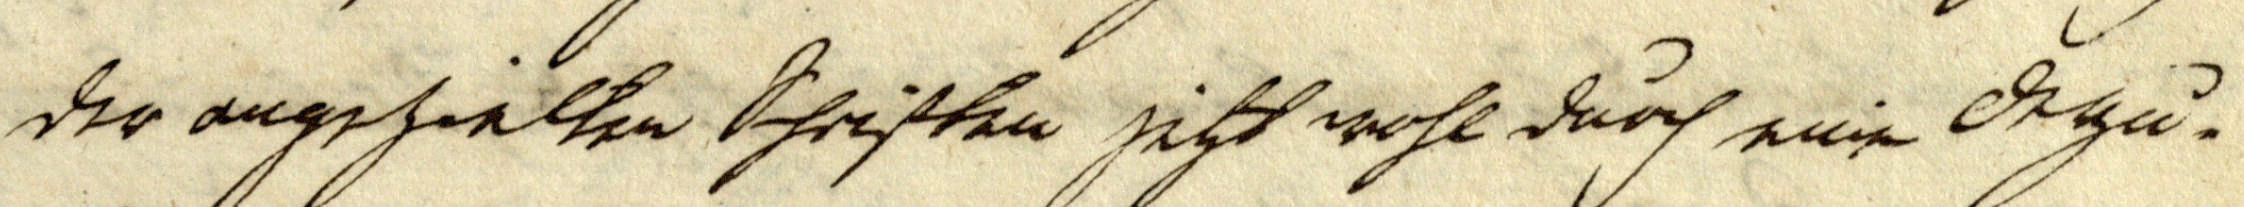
der angezielten Schriften jetzt wohl durch eine Depu¬
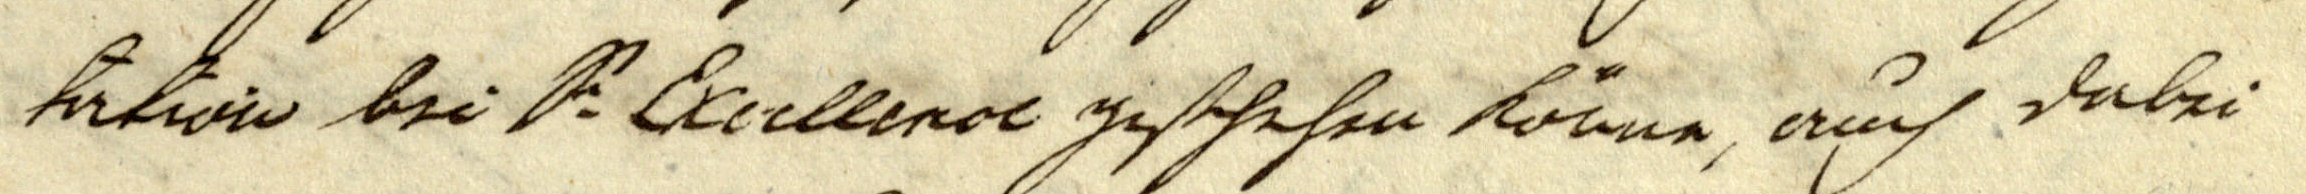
tation bei Sr. Excellence geschehen könne, auch dabei
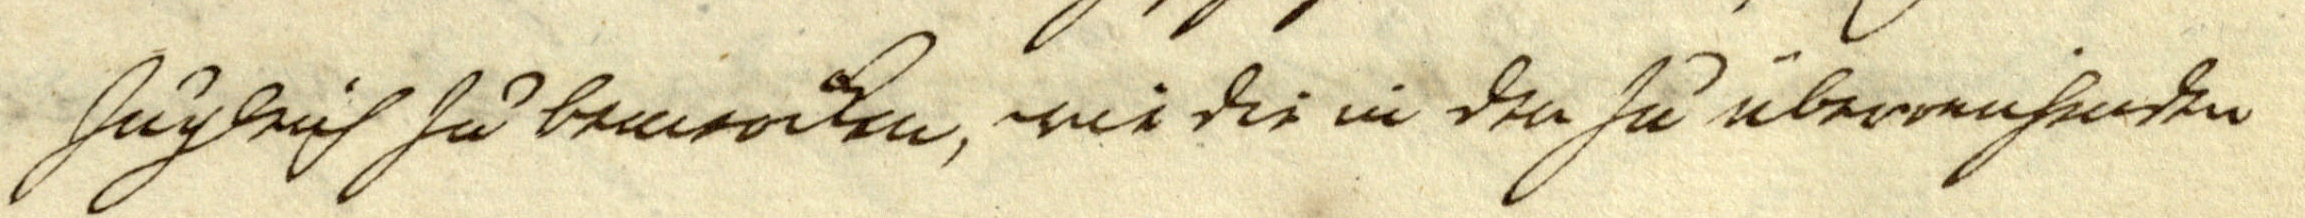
zugleich zu bemercken, wie die in den zu überreichenden
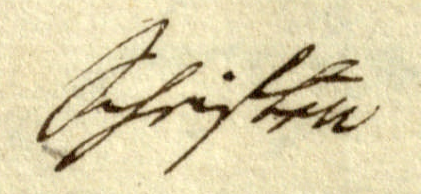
Schriften
